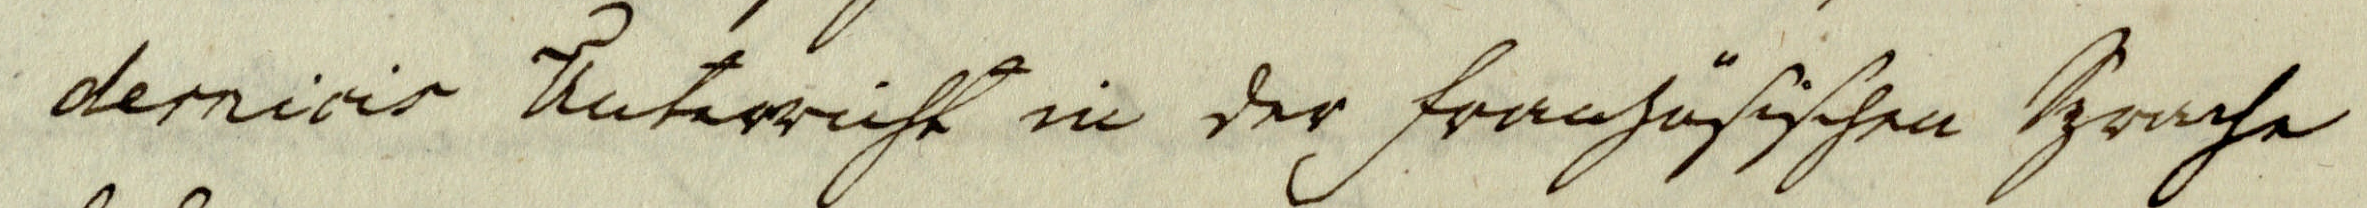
demicis Unterricht in der Französischen Sprache
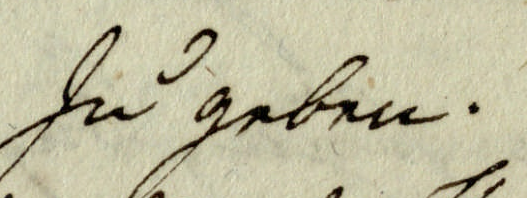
zu geben.
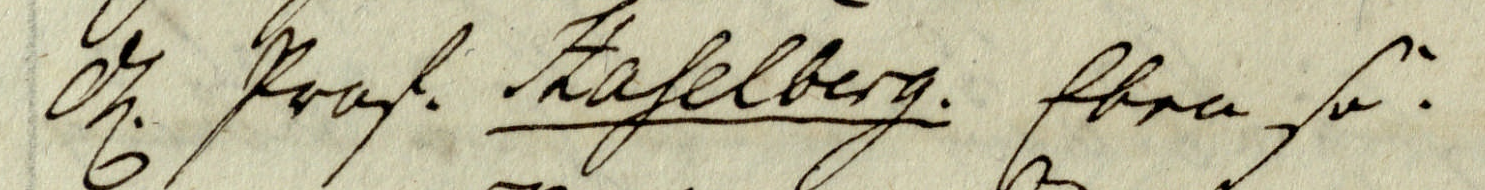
dh. Prof. Haselberg. Eben so.
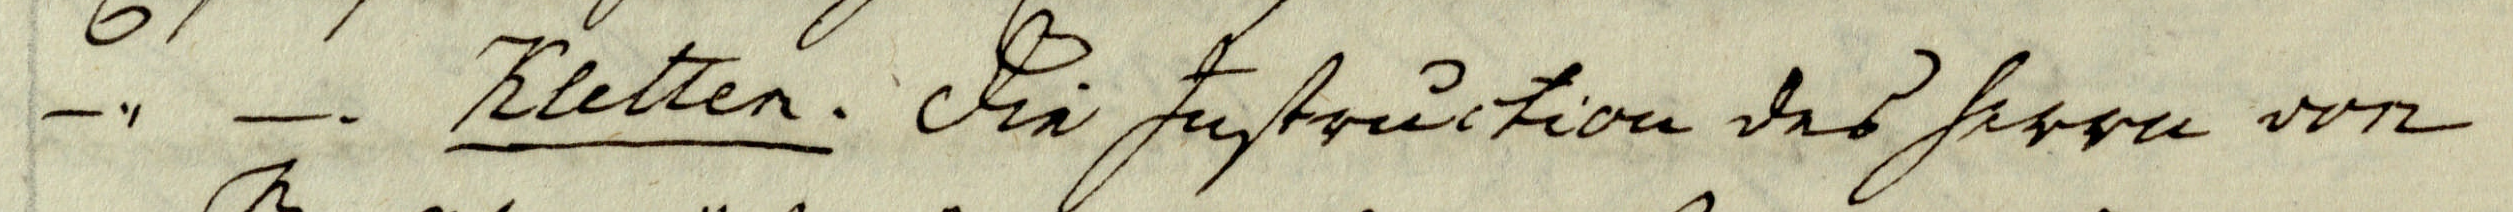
— " — . Kletten. Die Instruction des Herrn von
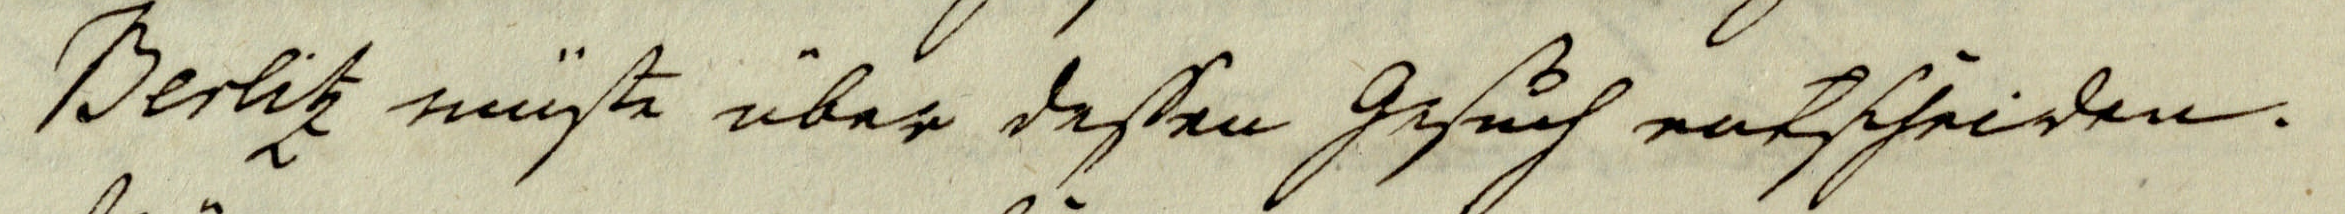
Berlitz müsste über dessen Gesuch entscheiden.
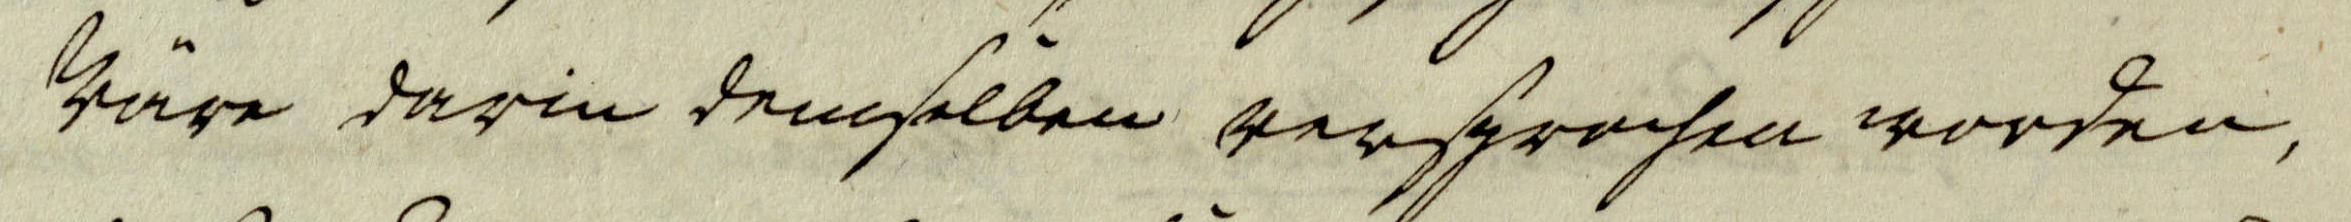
Wäre darin demselben versprochen worden,
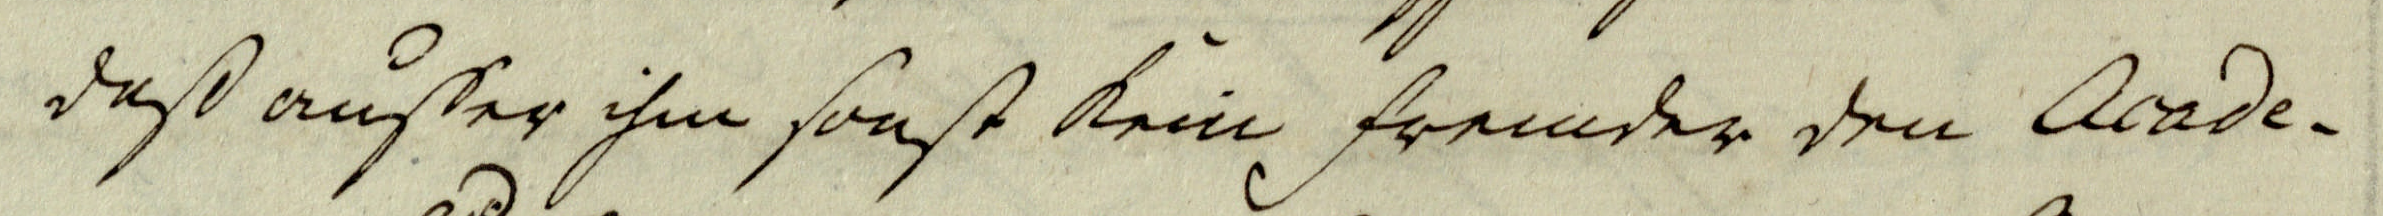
daß ausser ihm sonst kein Fremder den Acade¬
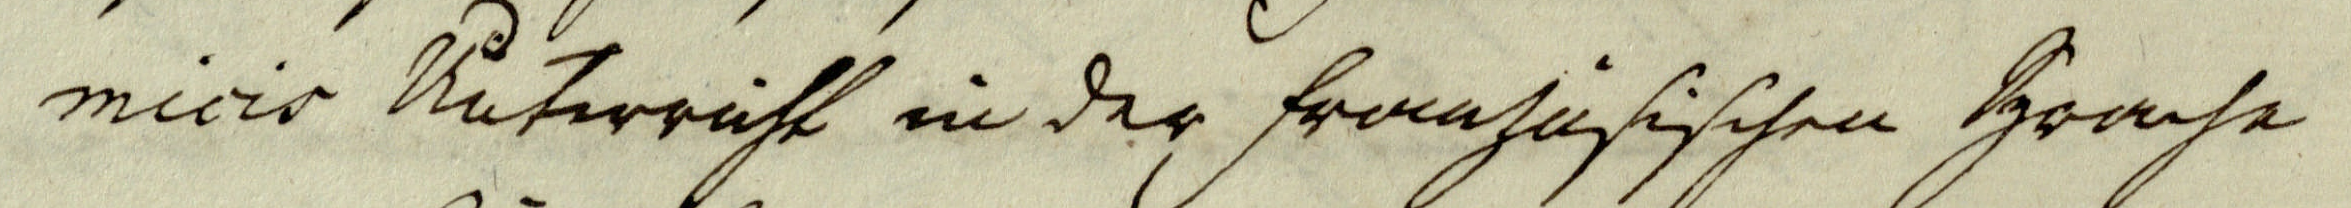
micis Unterricht in der Französischen Sprache
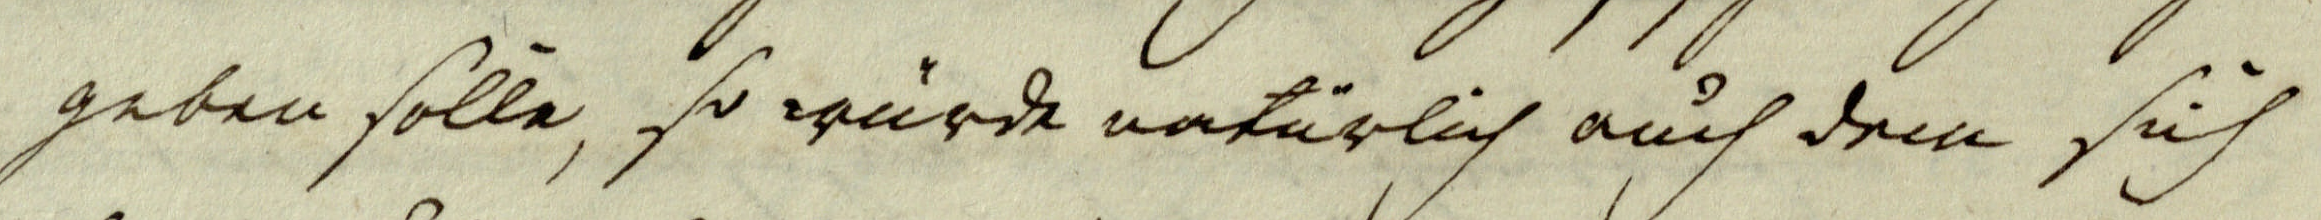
geben solle, so würde natürlich auch dem sich
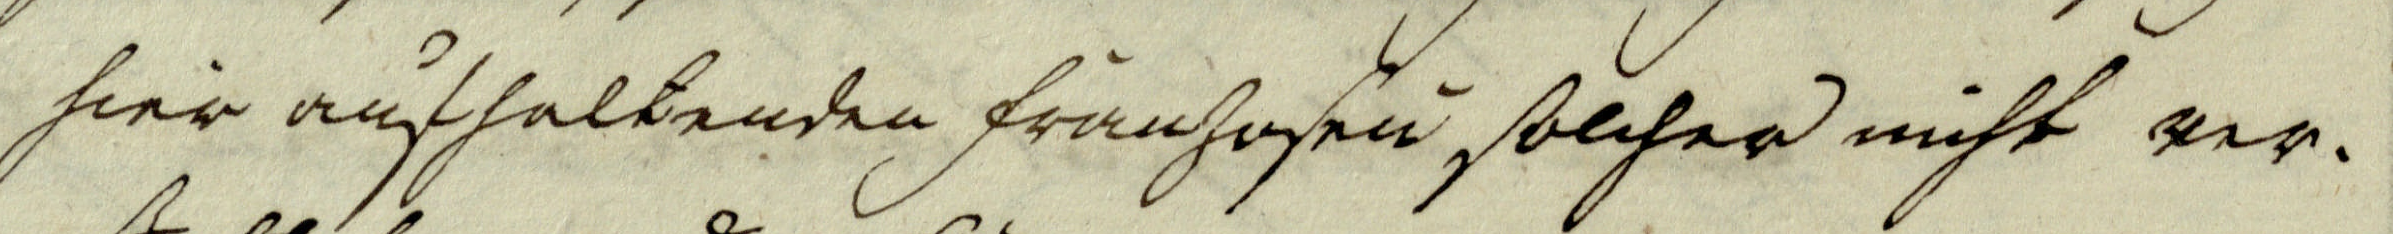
hier aufhaltenden Franzosen solcher nicht ver¬
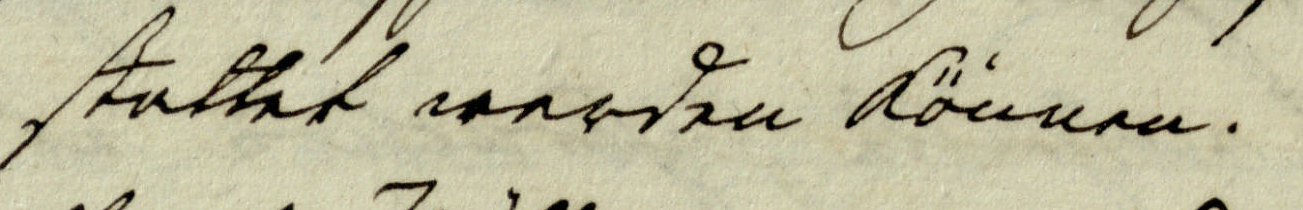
stattet werden können.
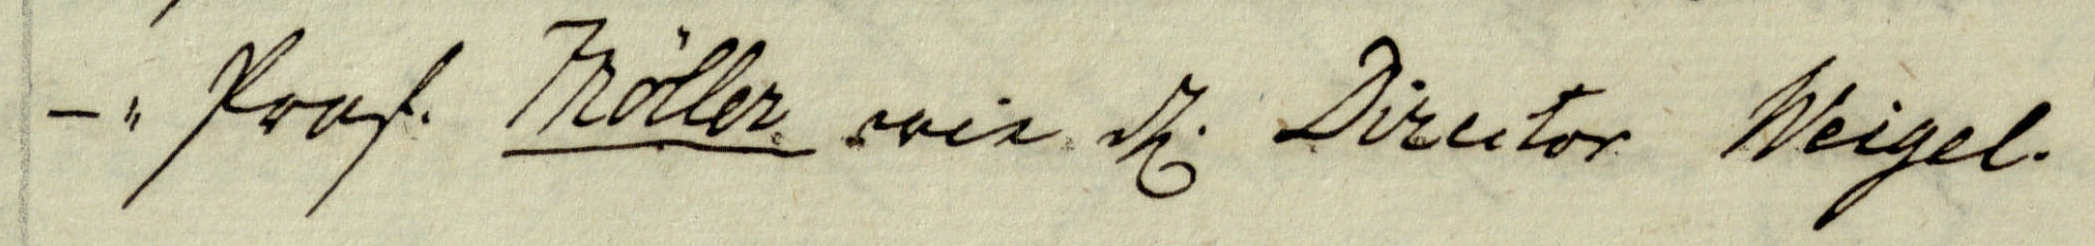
— " Prof. Möller. wie dh. Director Weigel.
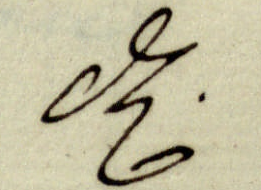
dh.
